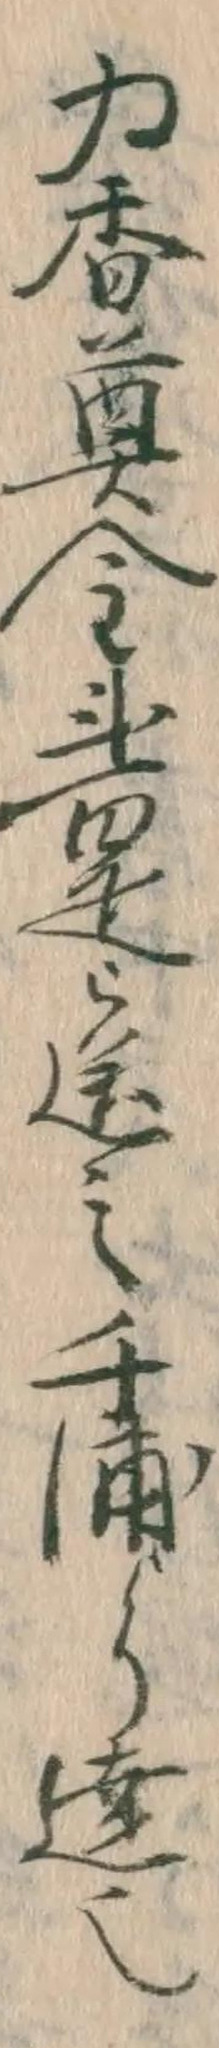為香奠金弐百疋被送之千浦より達也
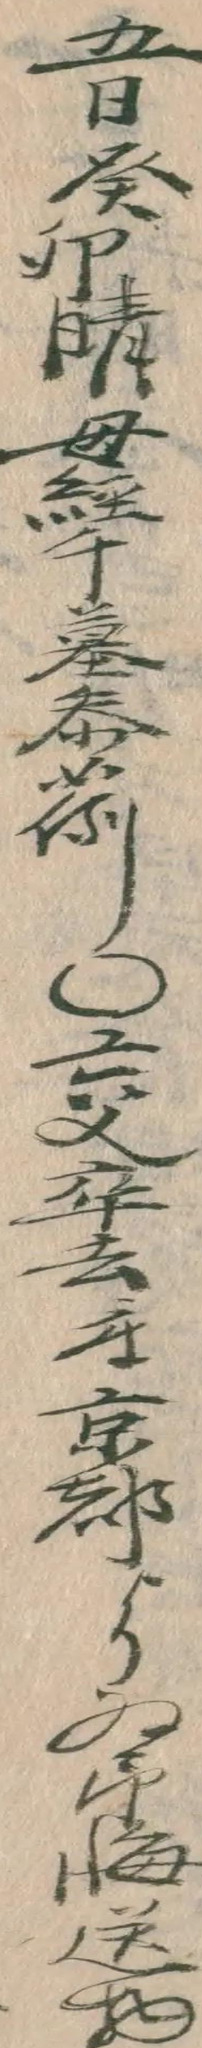五日癸卯晴母経千墓参如例〇亡父卒去ニ付京都より為御悔送物
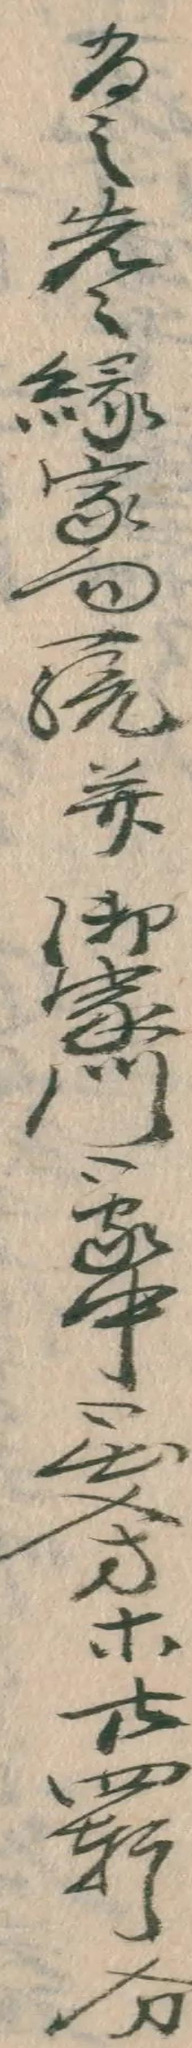有之先々縁家向一統并御家門御家中御出入方等廿四軒分
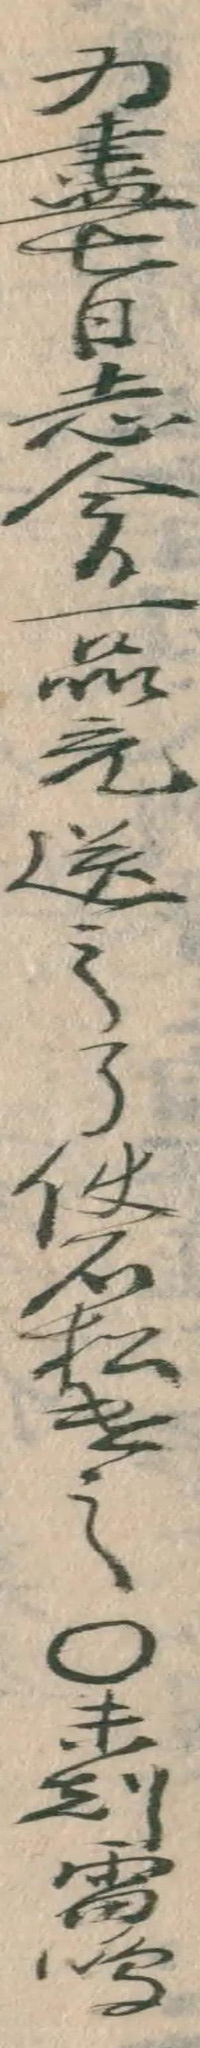為盡七日志今日一品充送之了使石松遣之〇未刻雷鳴
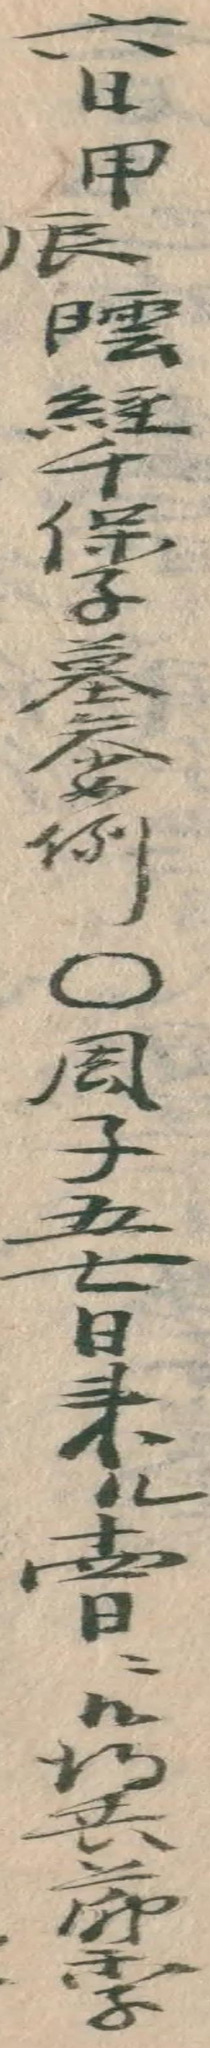六日甲辰曇経千保子墓参如例〇周子五七日来ル十四日ニ候得共節季
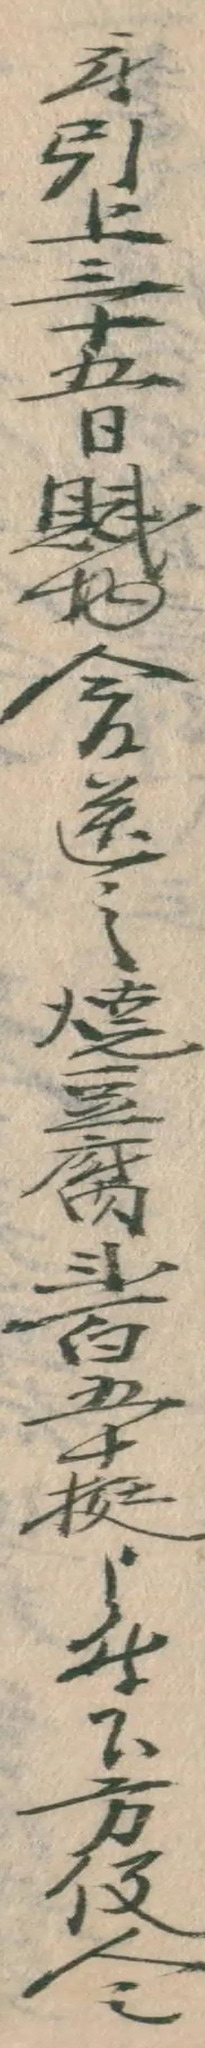ニ付引上三十五日賦物今日送之焼豆腐弐百五十挺申付下方役人之
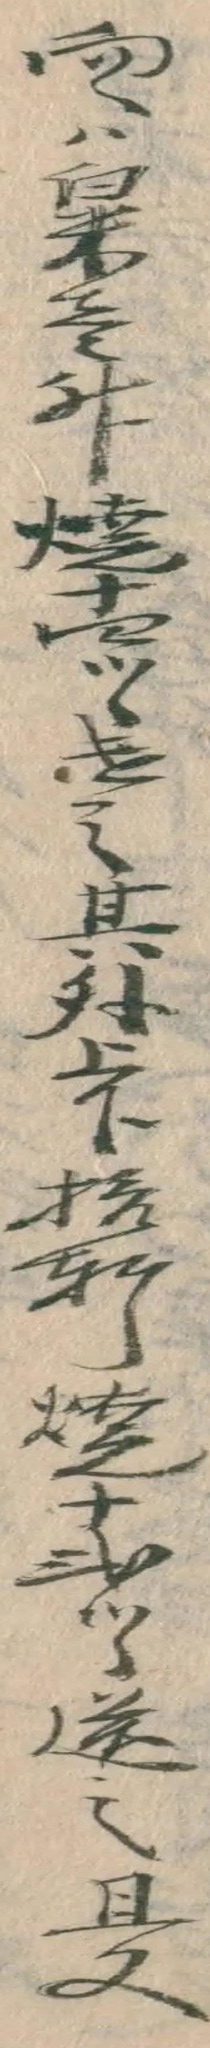向へハ白米壱升焼十四ツヽ遣之其外上下拾軒焼十弐ツヽ送之且又
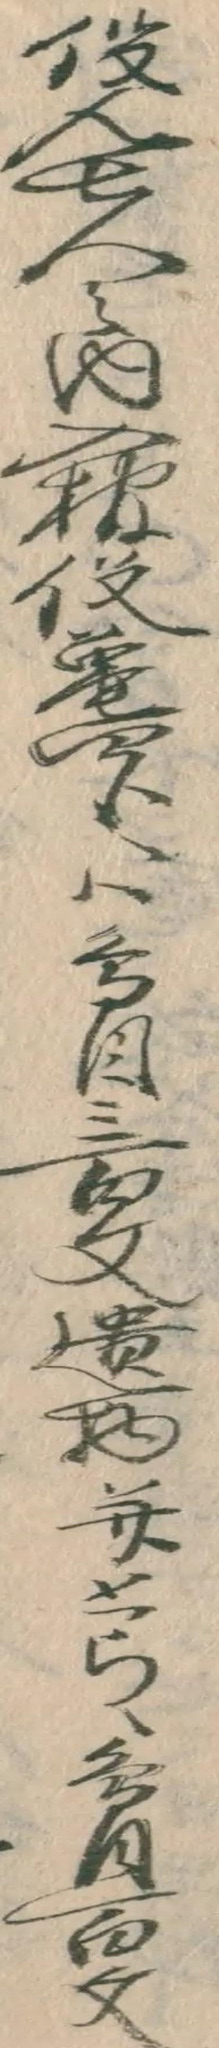役人七人之内入棺役亀四郎ヘハ鳥目三百文遺物并とらヘ鳥目百文
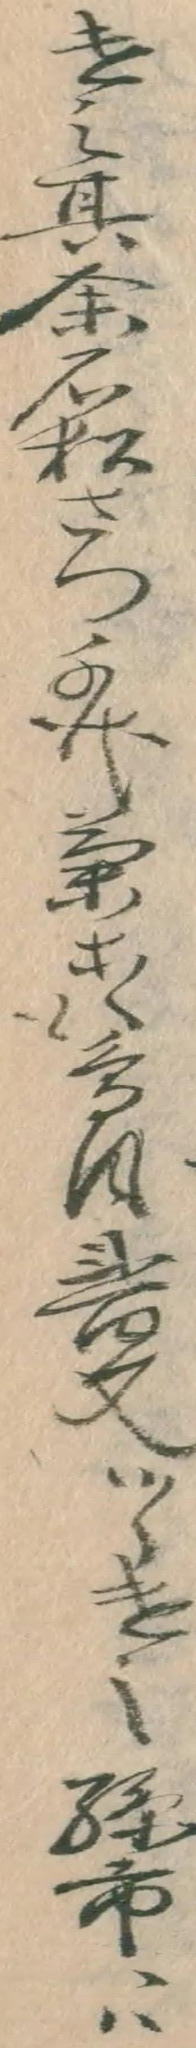遣之其余石松さつ手代菊等へ鳥目弐百疋ツヽ遣之孫市ヘハ

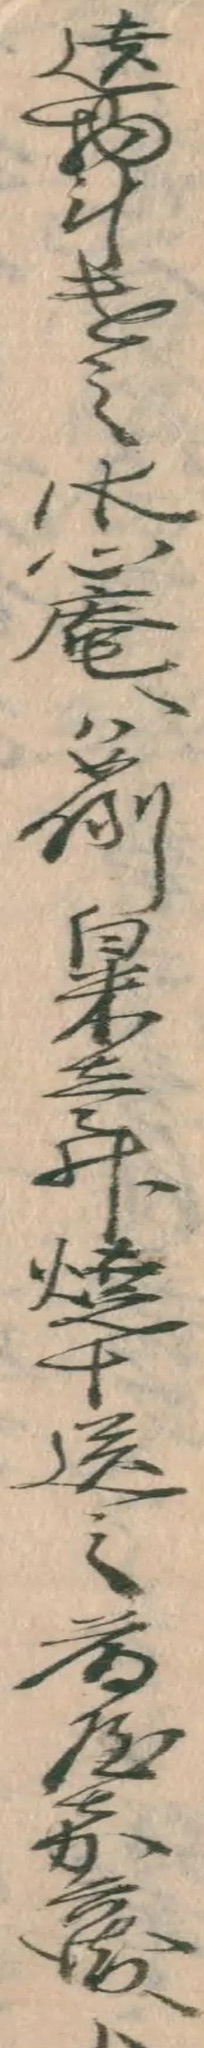送物斗遣之水心庵へハ如例白米壱升焼十送之藤屋嘉兵衛ヘハ
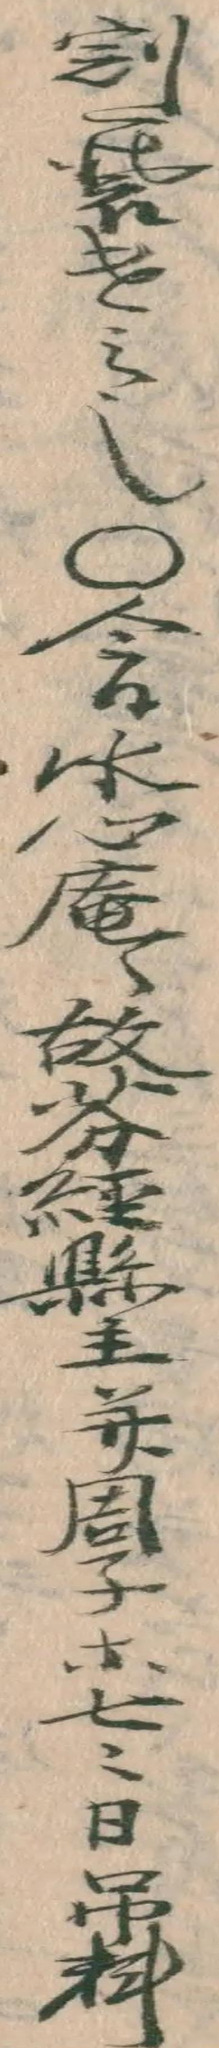割袋遣之也○今日水心庵之故芬経縣主并周子等七々日吊料
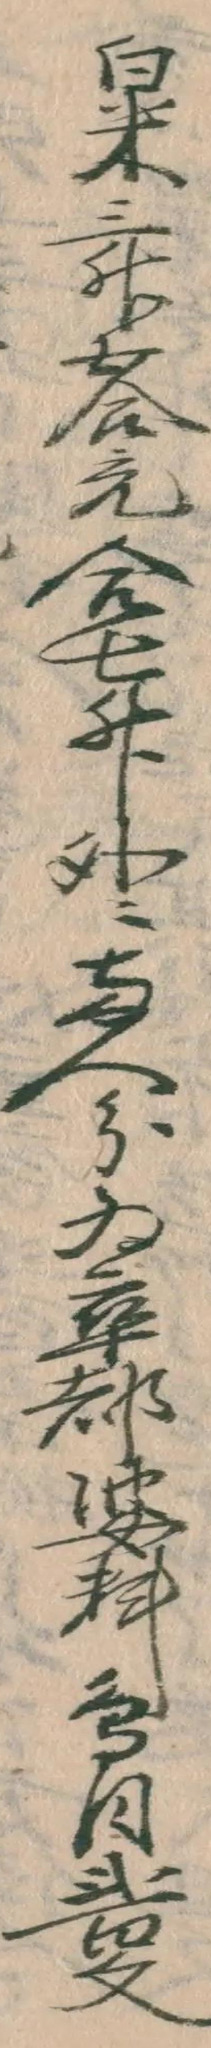白米三升五合充合七升外ニ両人分為卒都婆料鳥目弐百文
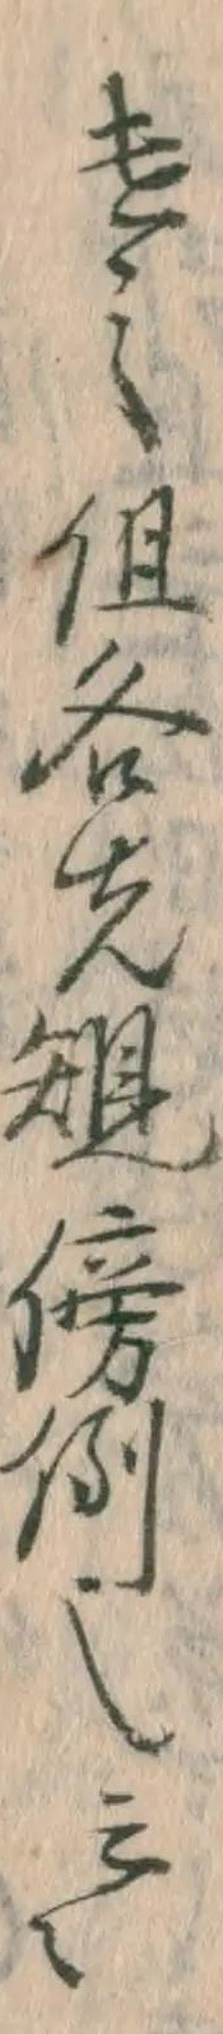遣之但各先規傍例也云々
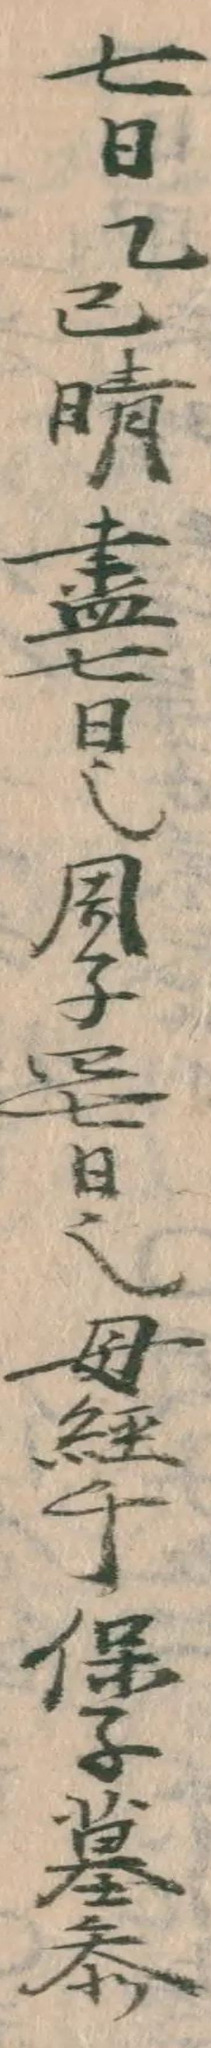七日乙巳晴盡七日也周子四七日也母経千保子墓参
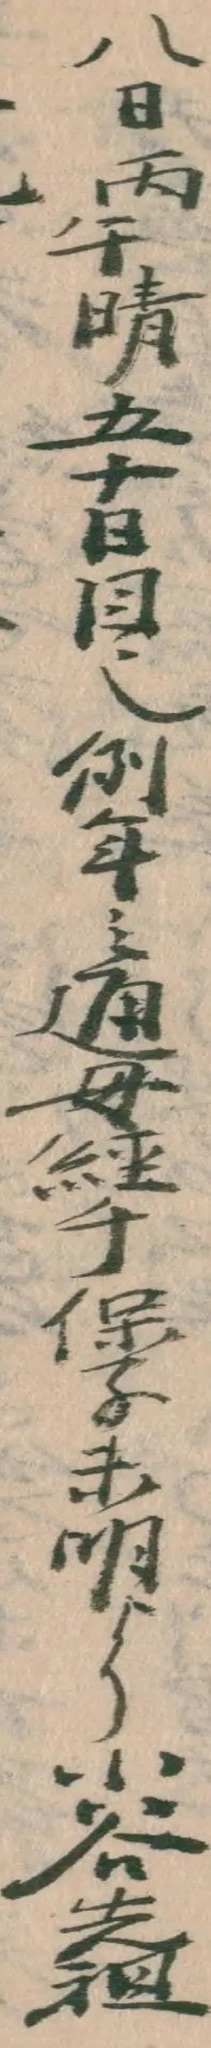八日丙午晴五十日目也例年之通母経千保子未明より小谷先祖
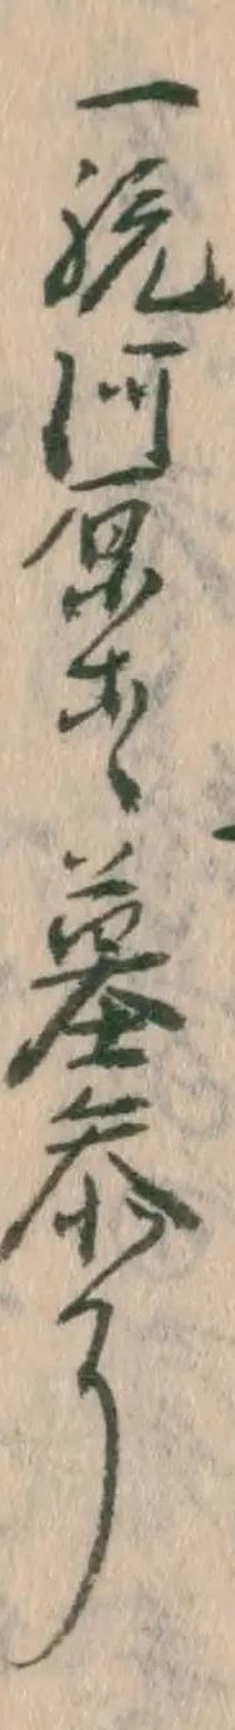一統河原等へ墓参了
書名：賀茂社記録. 第65冊
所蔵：国立国会図書館 National Diet Library, JAPAN
